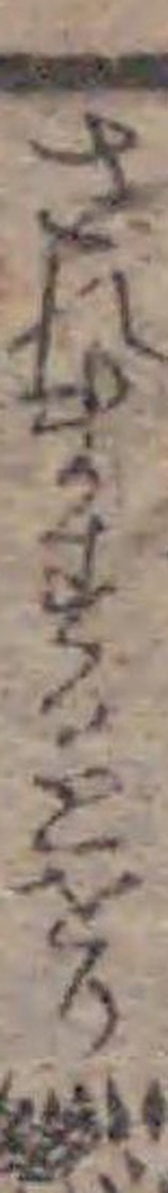されまするとをり
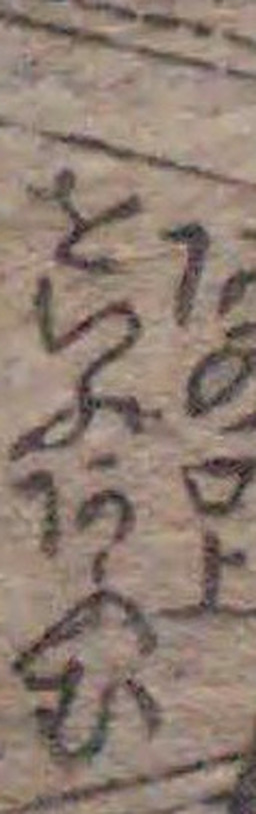をいふあふむ
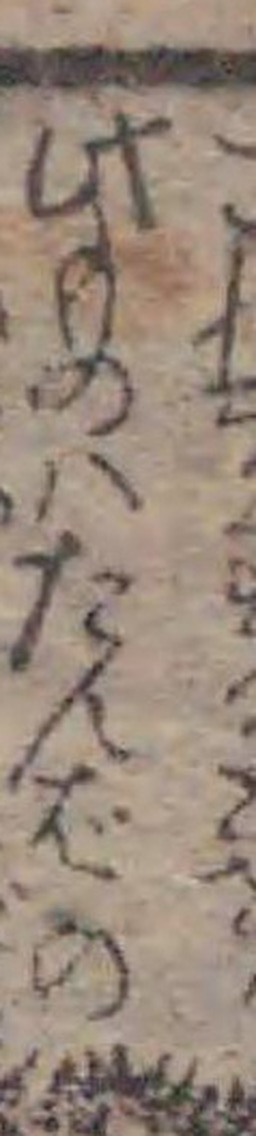此ものはたんばの
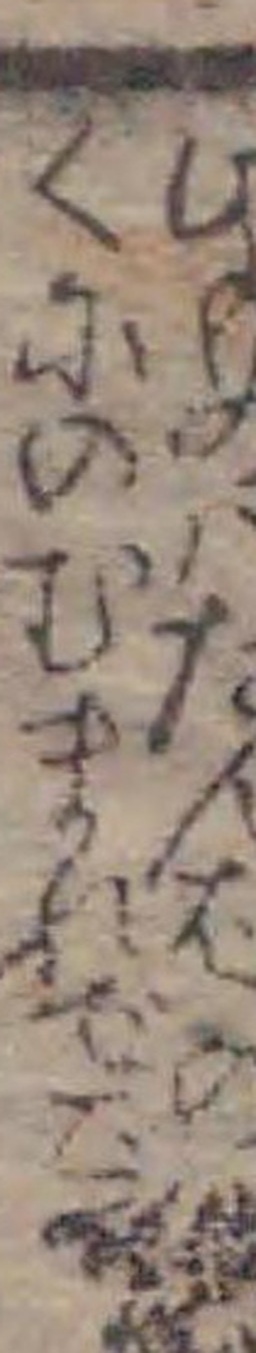くにのむまれでご
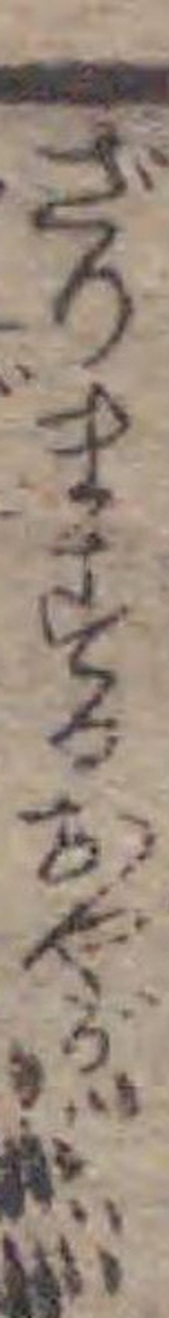ざりまするおやが
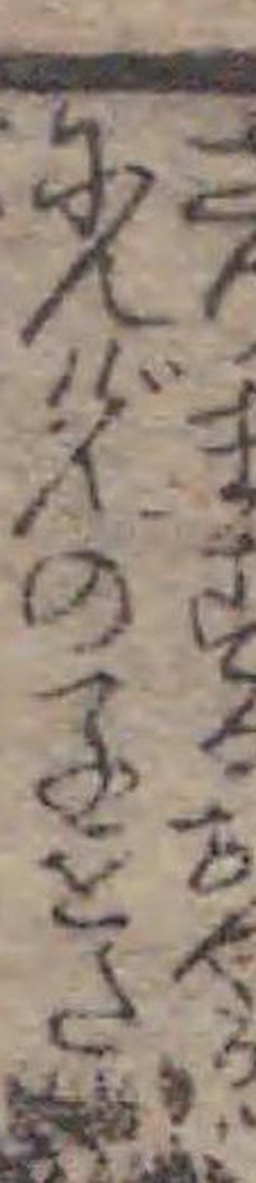にんげんの子をた
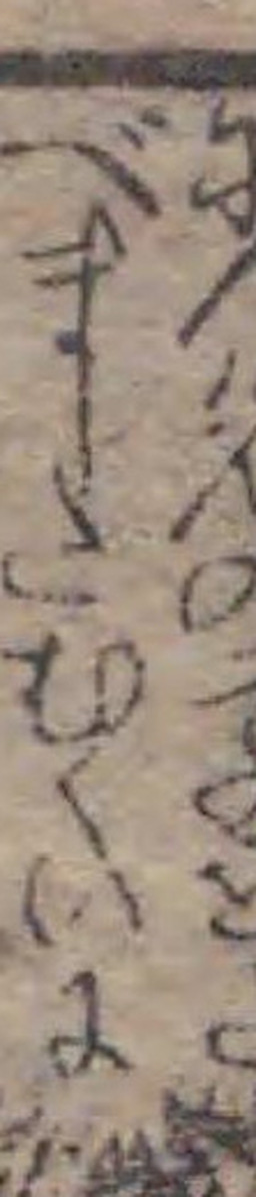べましたむくいに
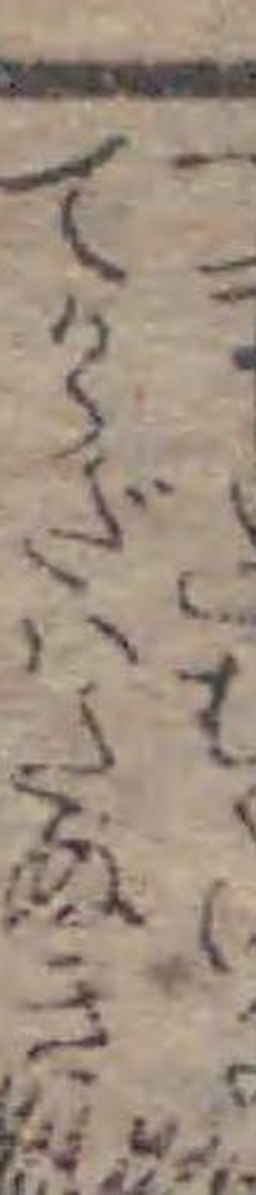てからだはたぬき
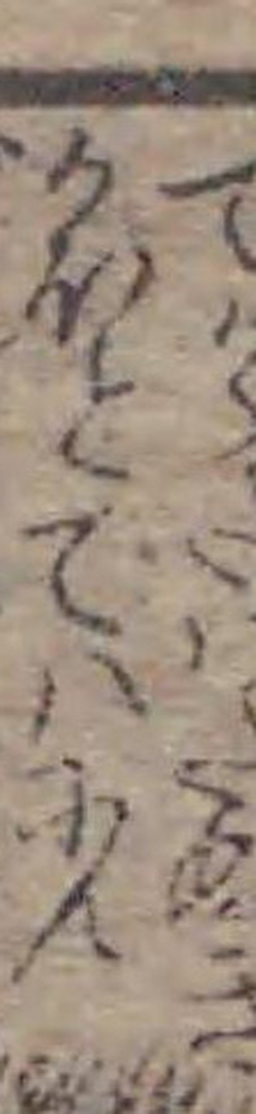かほとてはにん
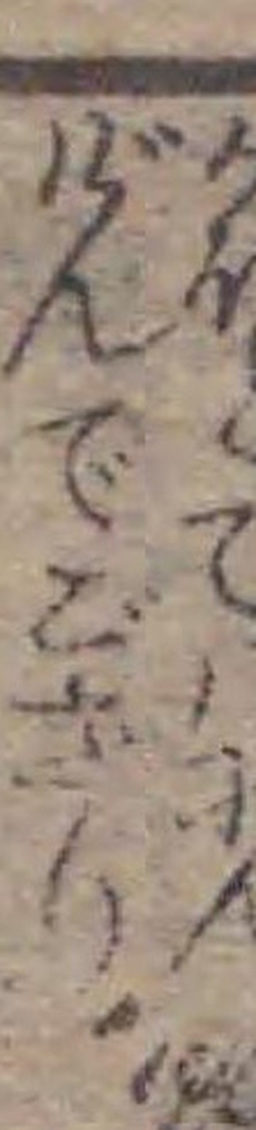げんでござり
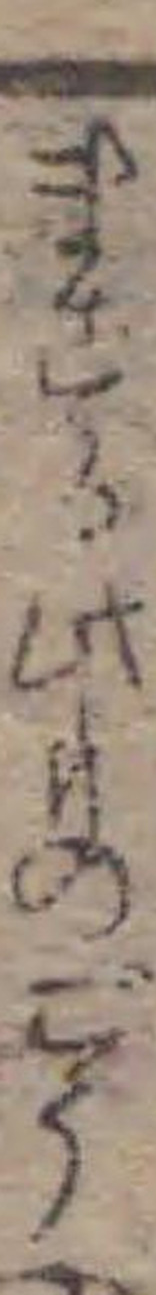まする此身のごう
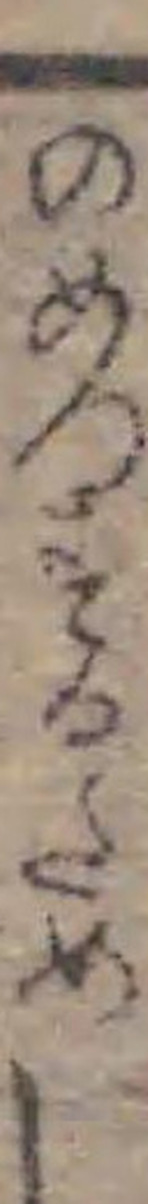のめつするため
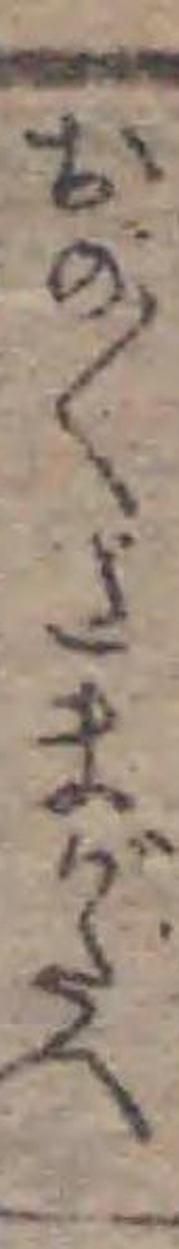おの〳〵さまがたへ
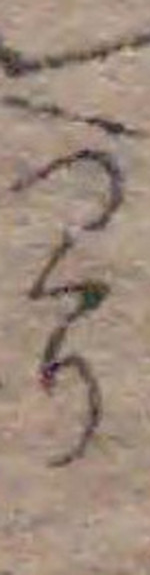つくり
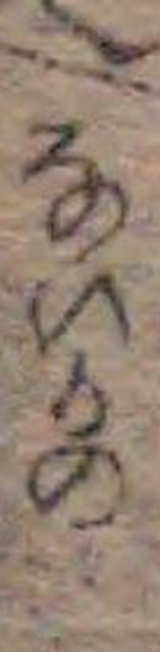ないかの
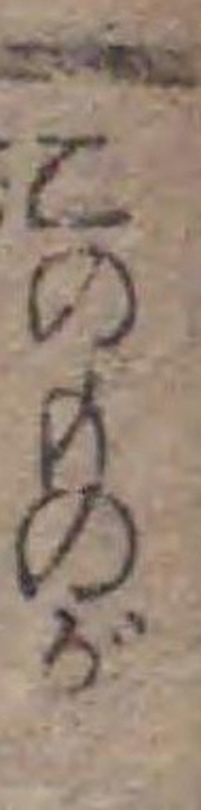このものが
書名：化物七段目 : 2巻
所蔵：国立国会図書館 National Diet Library, JAPAN
